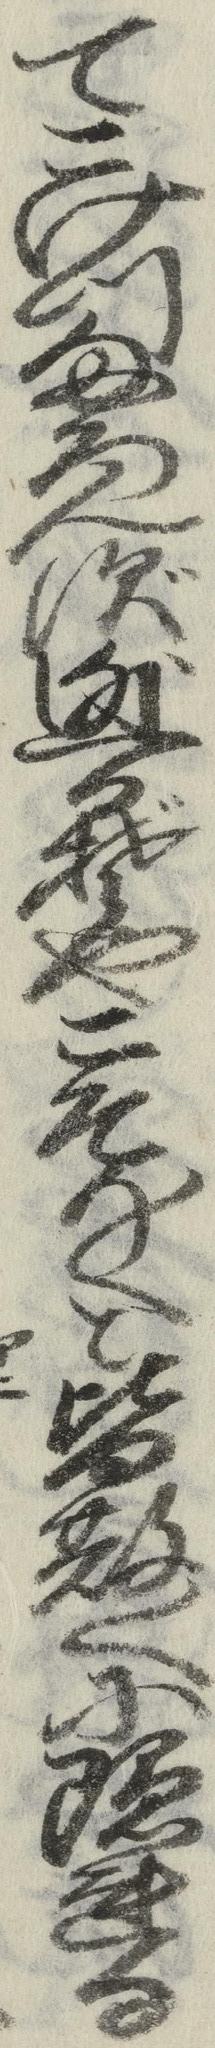てこけつまろんず迯るぞやこそり〳〵と見散〳〵に隠れる
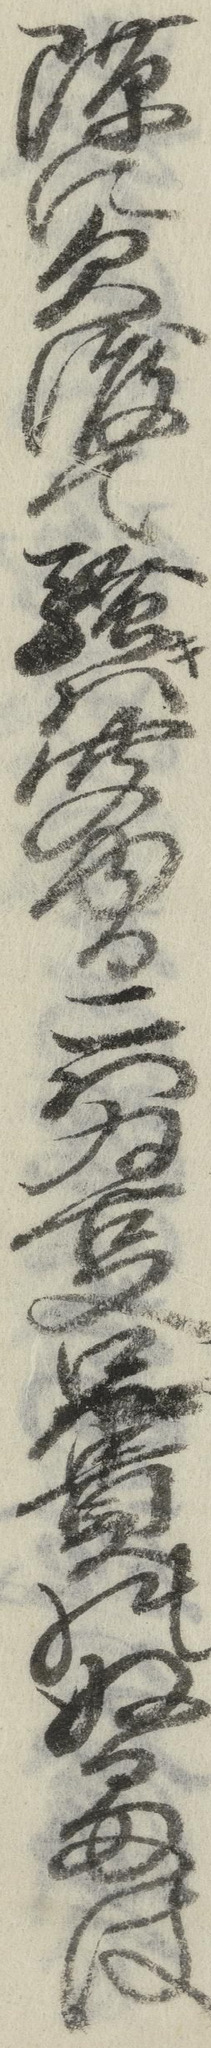隙に欠渡て騒聞ゆるにはゐ事兄貴のぬるまは

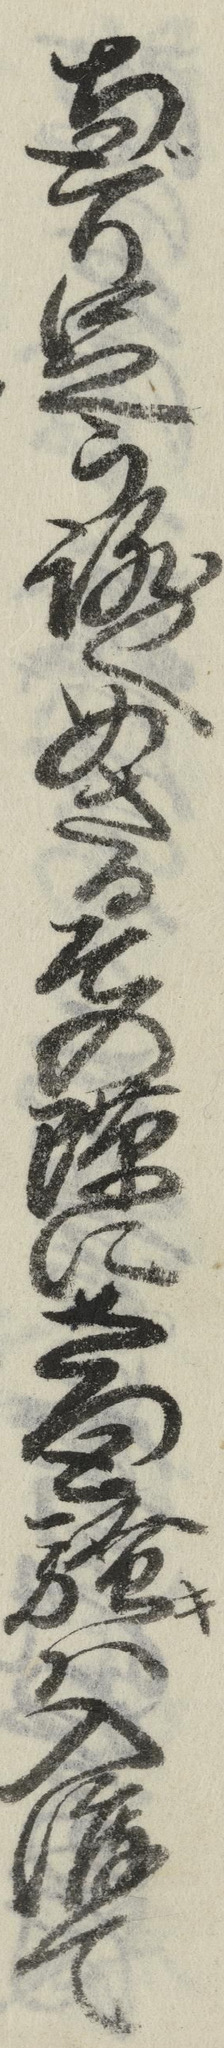ちどり足う詬くめさるその隙にさつと騒入渡て
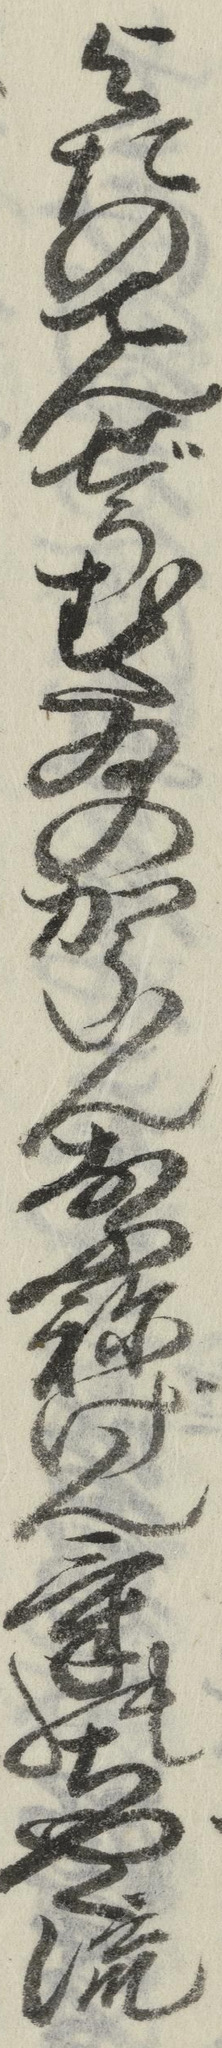よたのてんぜうむたゐのかういんなふ様げん望のちやく流
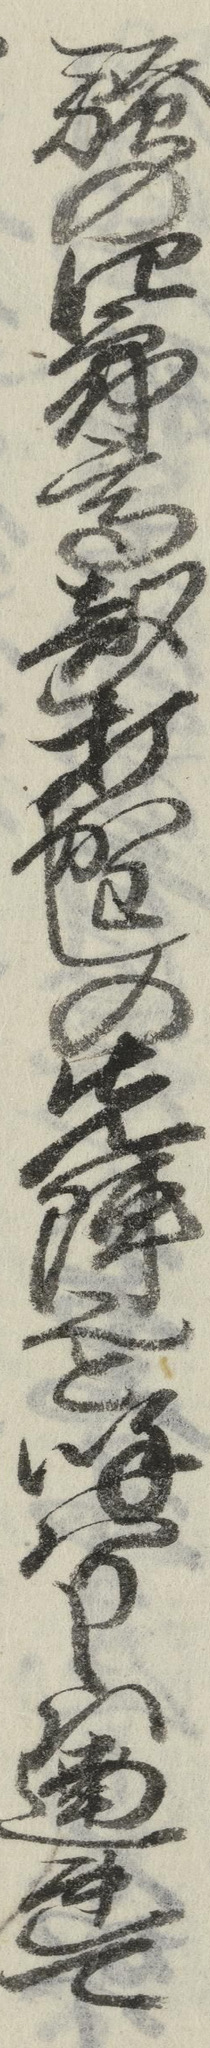騒の四郎高叡打かわしの先陣也と呼はりしは遖迚て
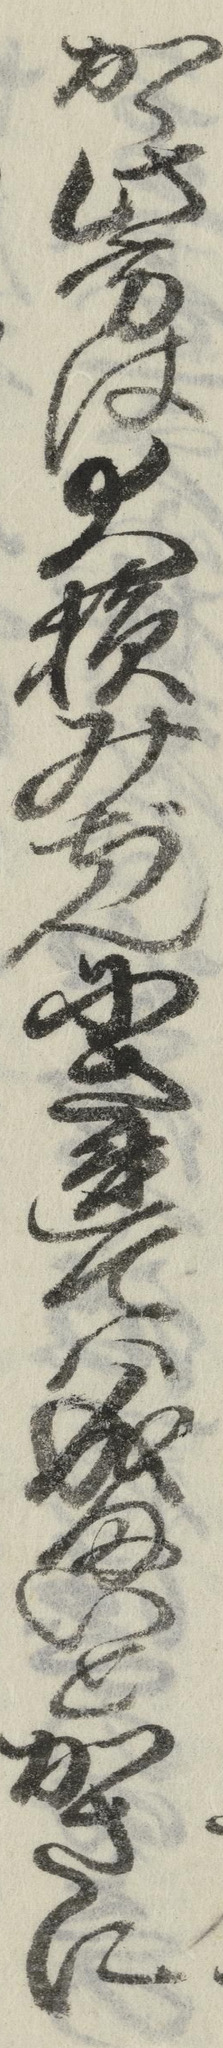から此方は大横みぢんにされては成まいとかさに
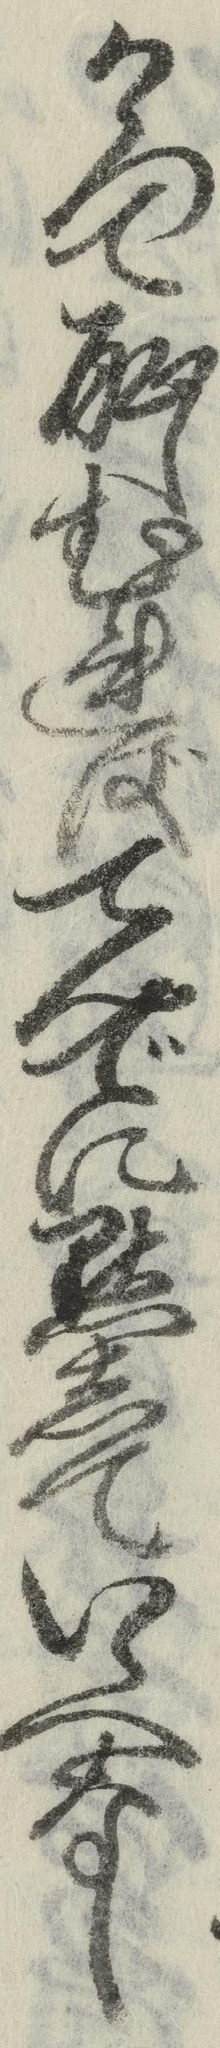かつて恥むればてんでに黙していへなし
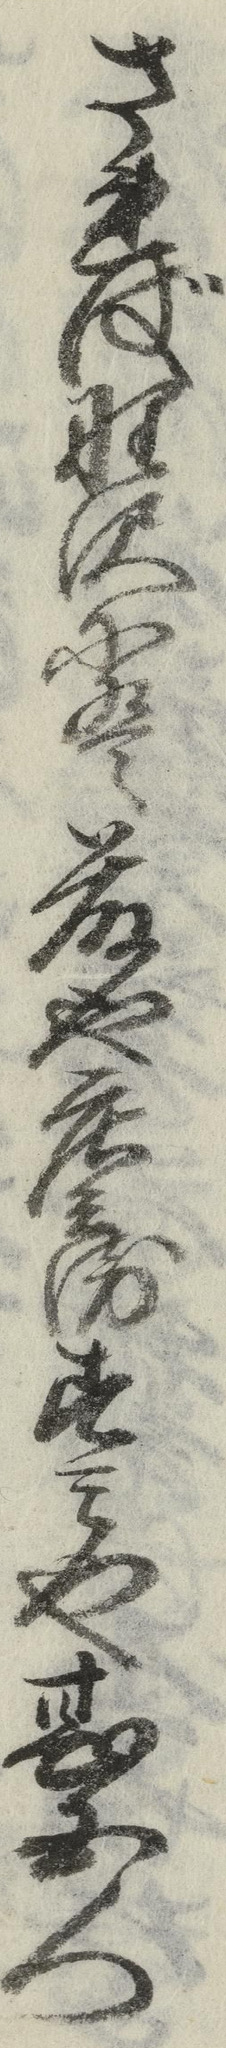されば野沢に有し藤や庄兵衛すみや甚五郎
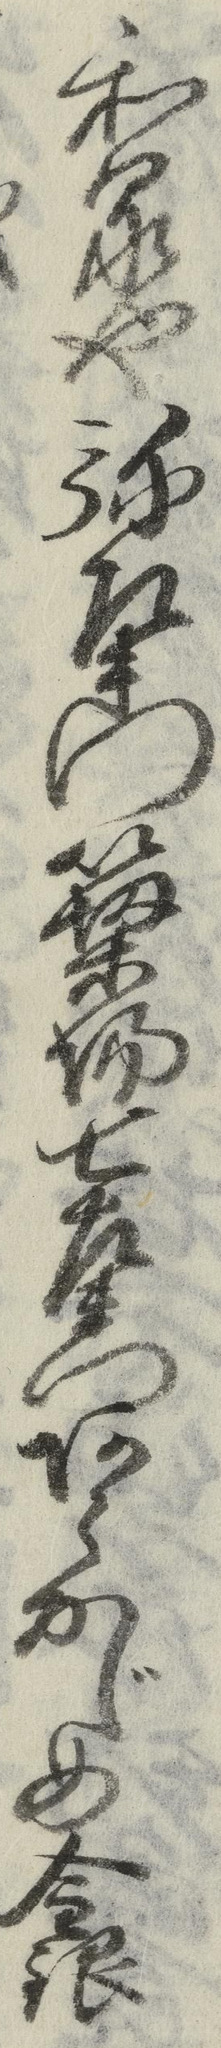和泉や弥左衛門簗場七左衛門あらかじめ金銀
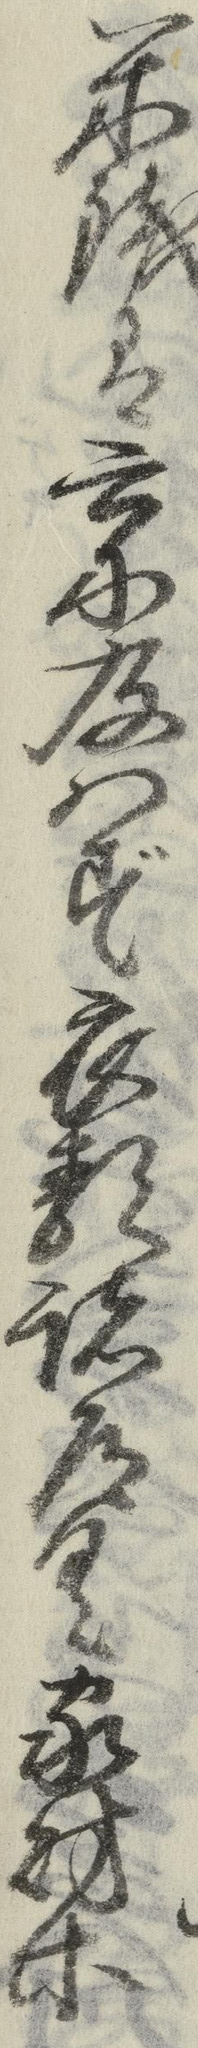米銭は云に及はず衣類諸道具家財等
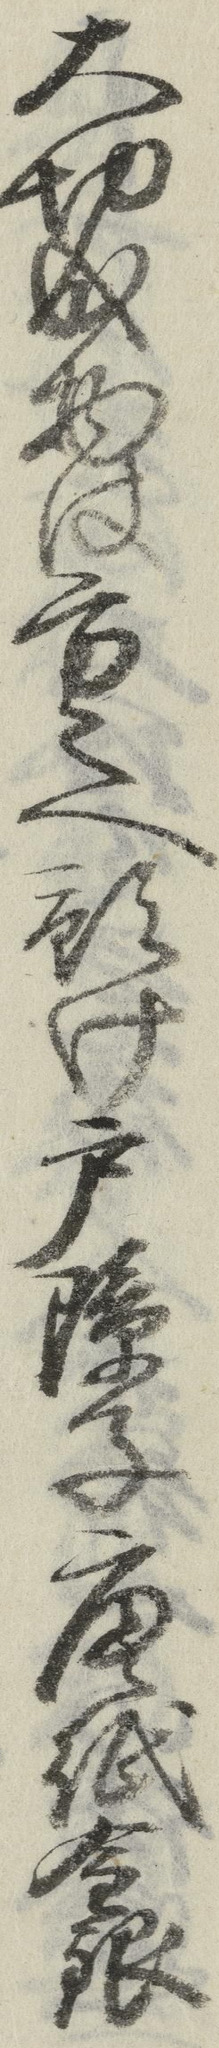大切成物は方々へ預け戸障子唐紙金銀
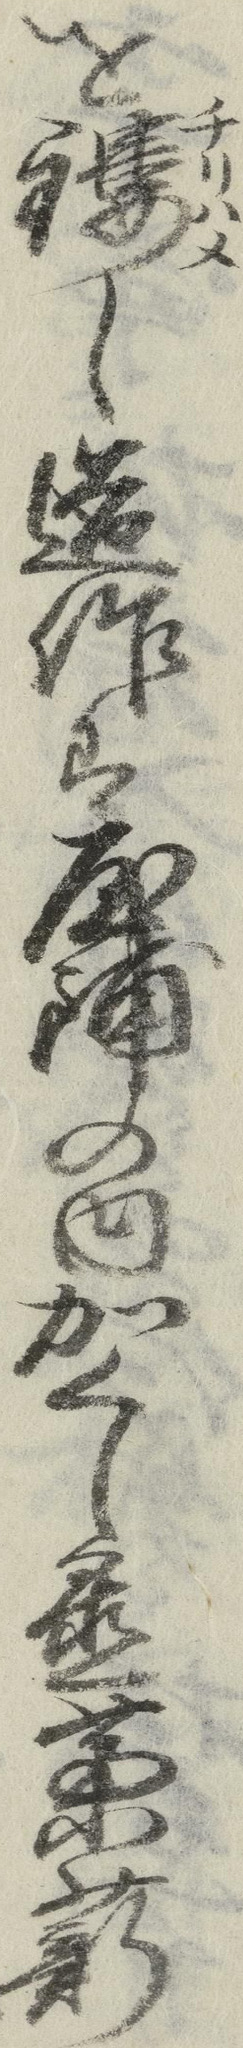を鏤し造作わ家舗の内かくし置藁薪
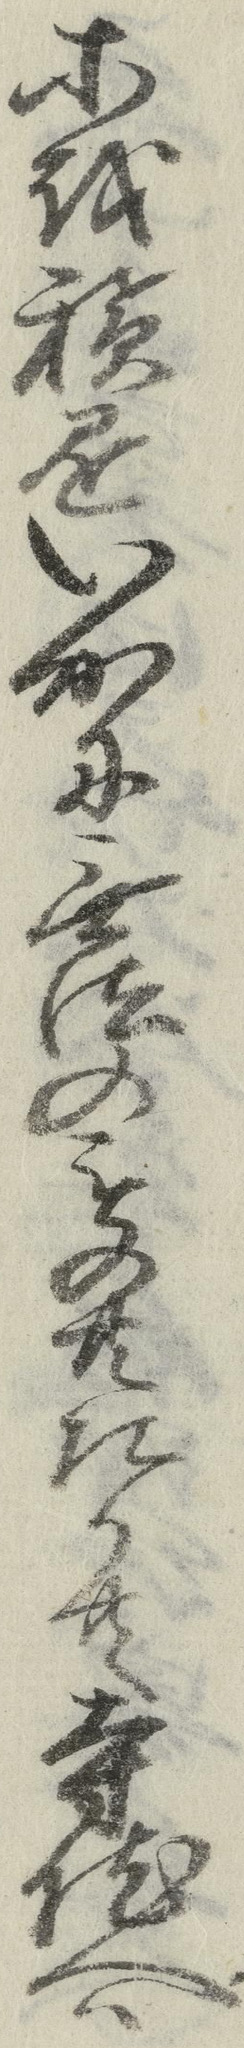等を積懸いかに無法のもの共たり共寺院へは
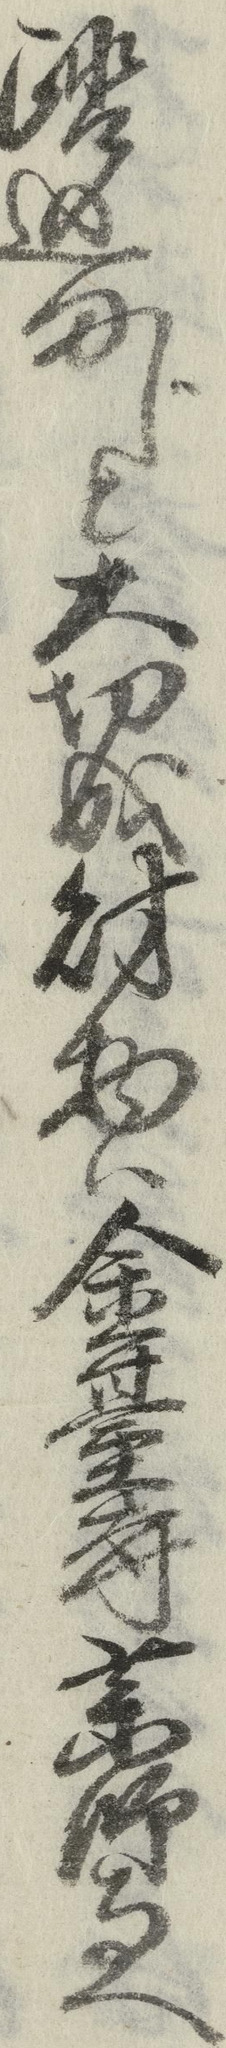踏込まじと大切成財物は金臺寺薬師寺へ
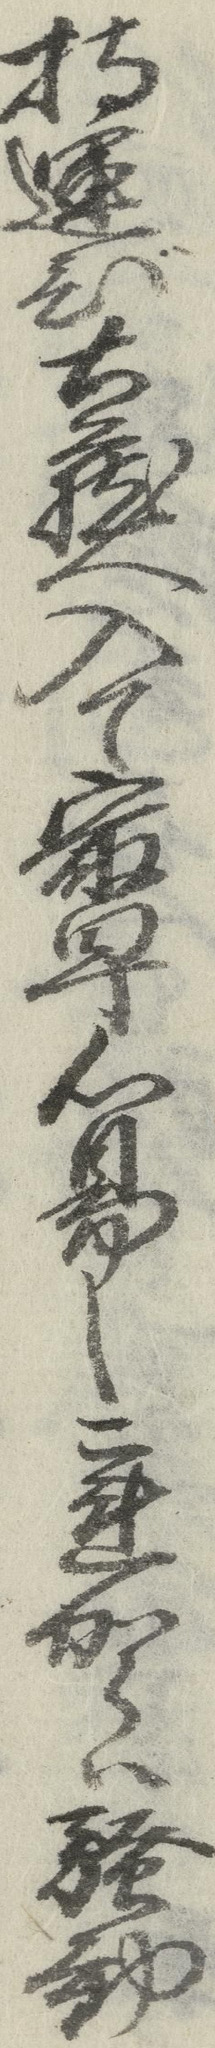持運び土蔵へ入て最早心易しこれからハ騒動
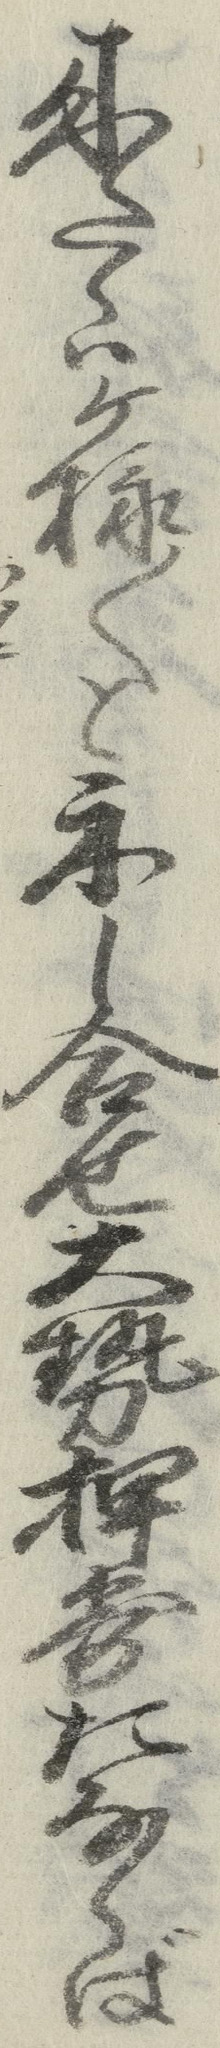来たらはケ様〳〵と示し合せ大勢押寄たならば
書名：浅間大焼騒動記　中
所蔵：東京大学地震研究所図書室 Earthquake Research Institute Library, The University of Tokyo, JAPAN
